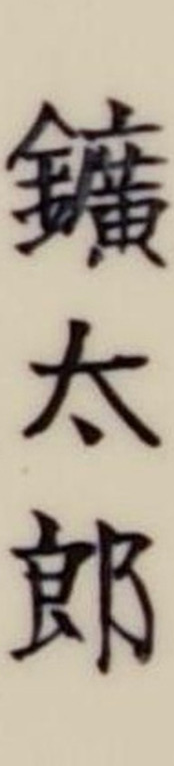鑛太郎
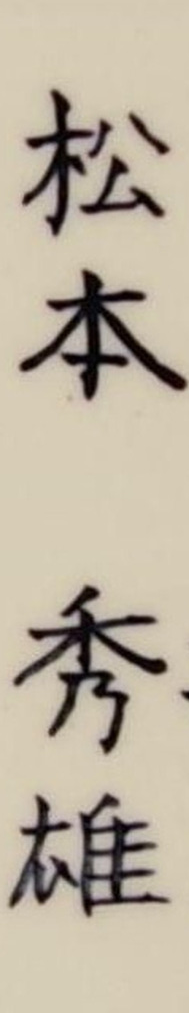松本秀雄

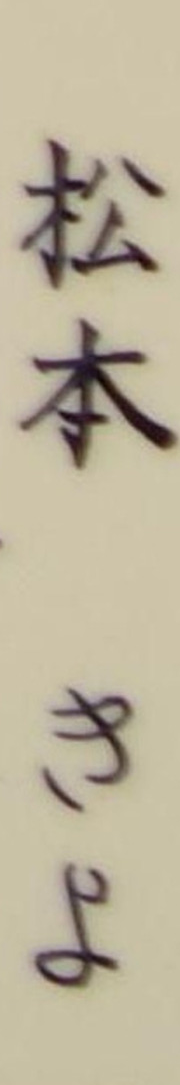松本きよ
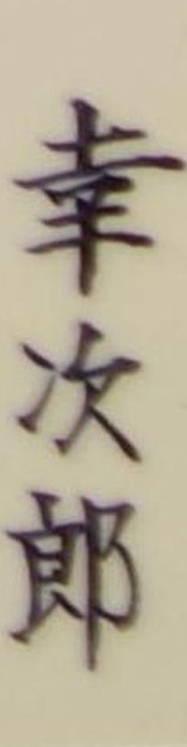幸次郎
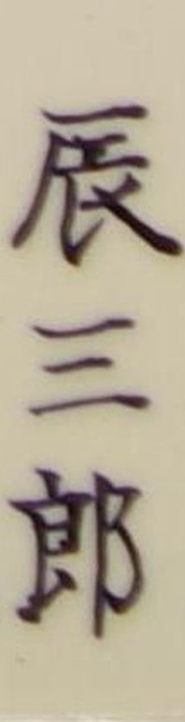辰三郎
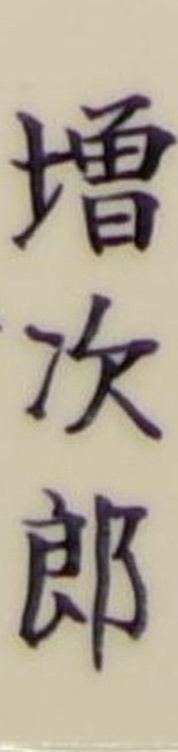増次郎
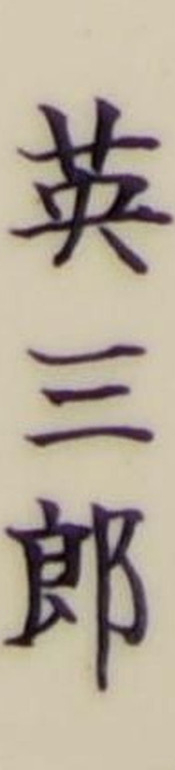英三郎
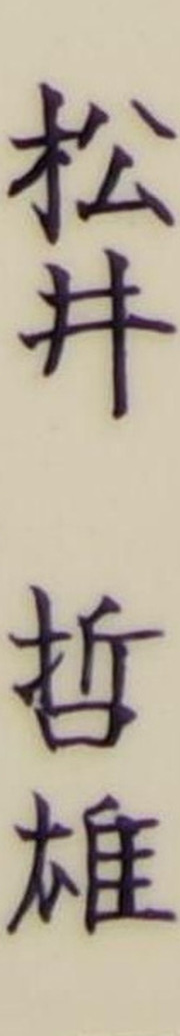松井哲雄
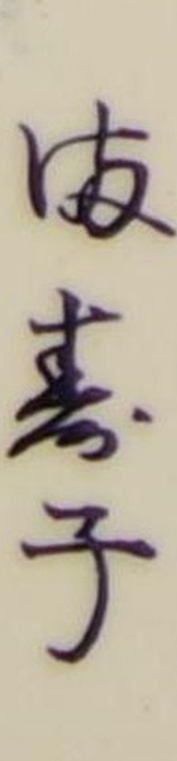ます子
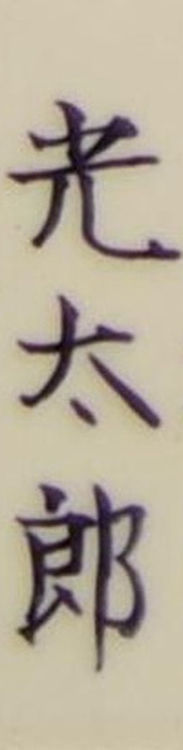光太郎

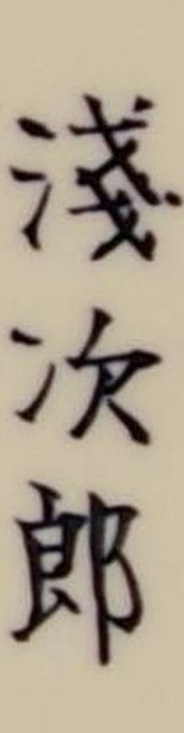浅次郎
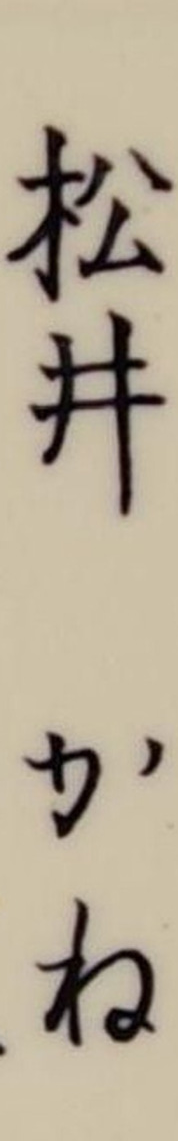松井かね
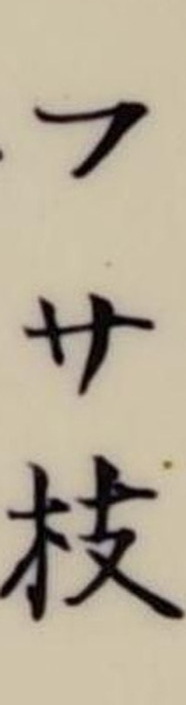フサ枝
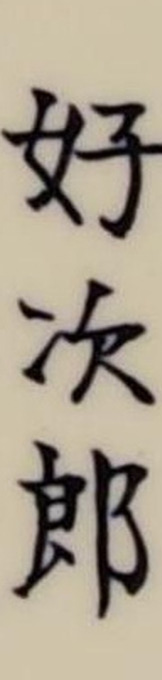好次郎
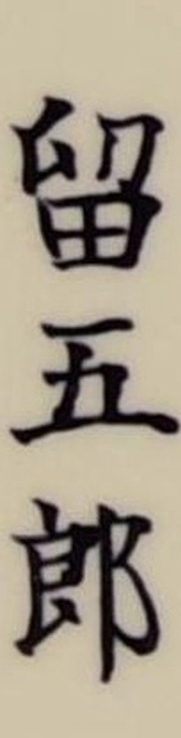留五郎
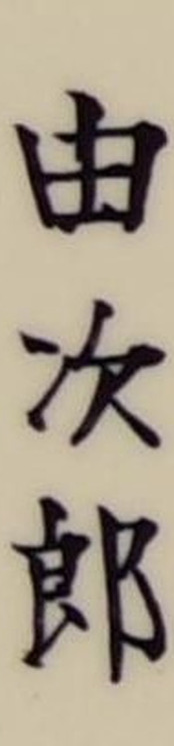由次郎
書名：A~D
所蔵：koyasan kongobuji
